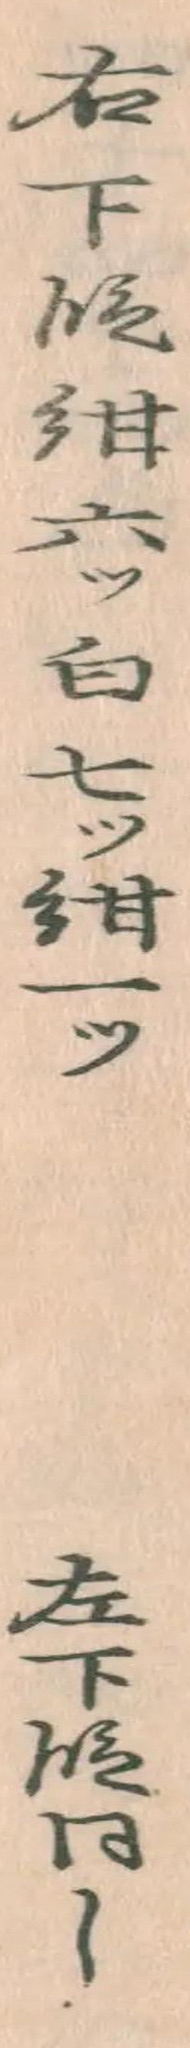右下段紺六ッ白七ッ紺一ッ左下段同し
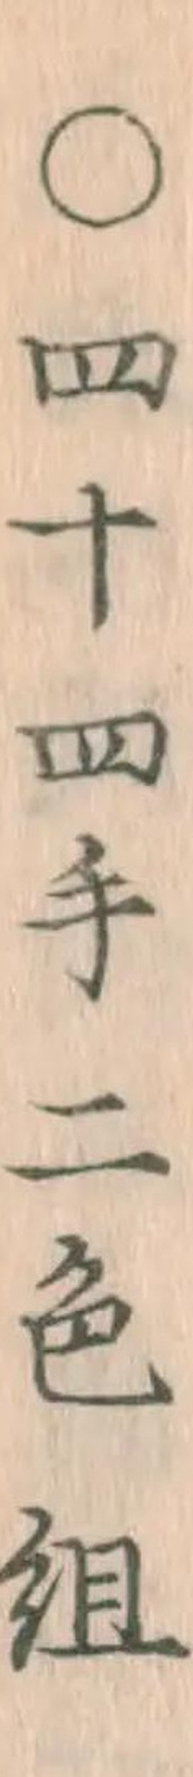○四十四手二色組
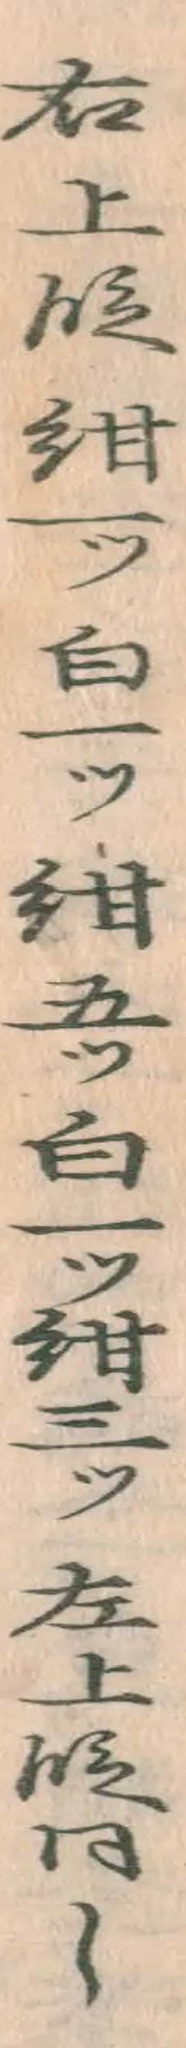右上段紺一ッ白一ッ紺五ッ白一ッ紺三ッ左上段同し
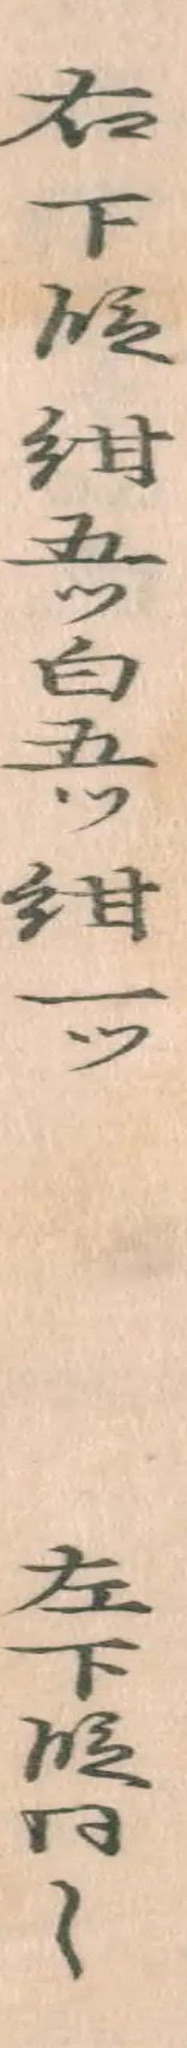右下段紺五ッ白五ッ紺一ッ左下段同し
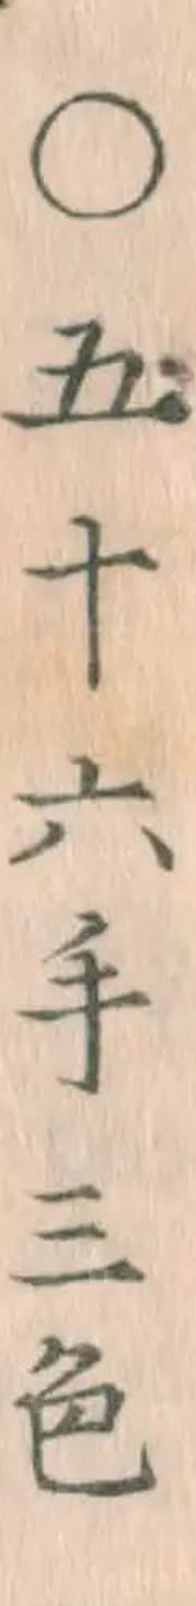○五十六手三色
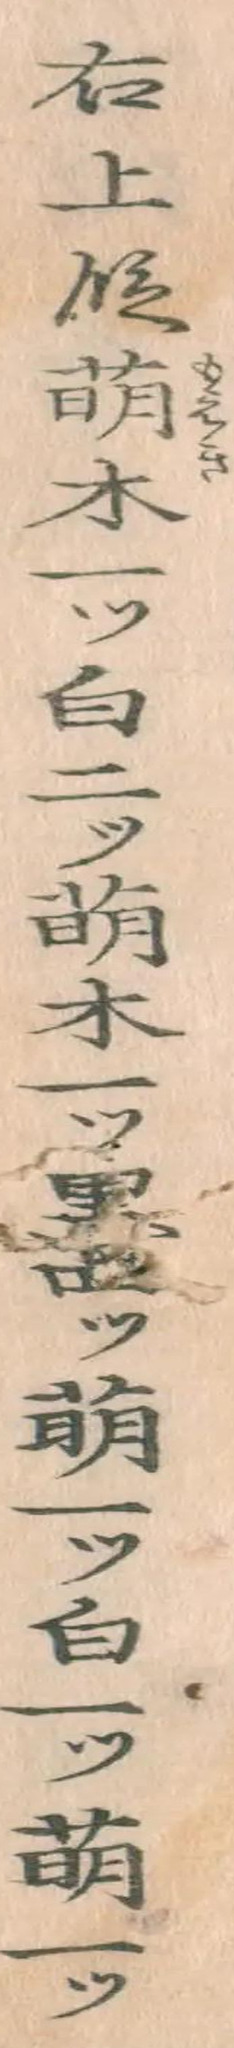右上段萌木一ッ白二ッ萌木一ッ黒四ッ萌一ッ白一ッ萌一ッ
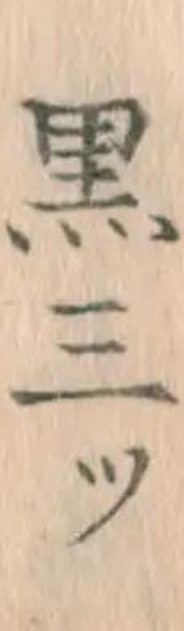黒三ッ
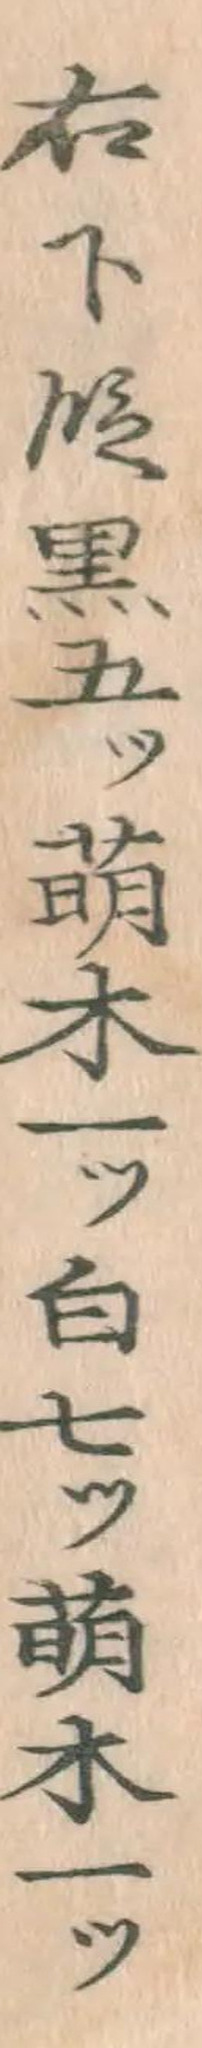右下段黒五ッ萌木一ッ白七ッ萌木一ッ

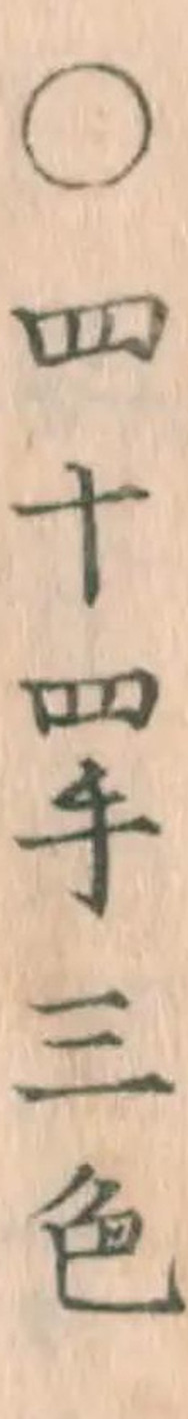○四十四手三色
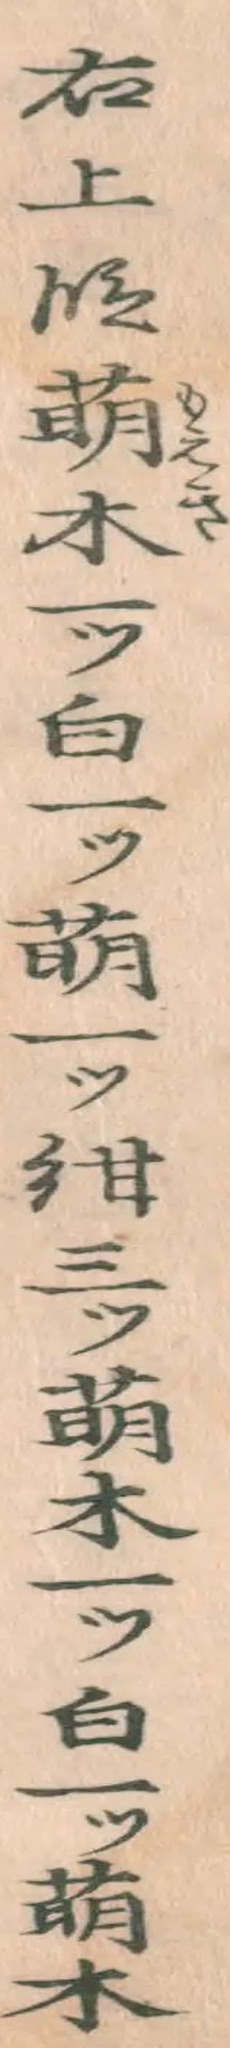右上段萌木一ッ白一ッ萌一ッ紺三ッ萌木一ッ白一ッ萌木
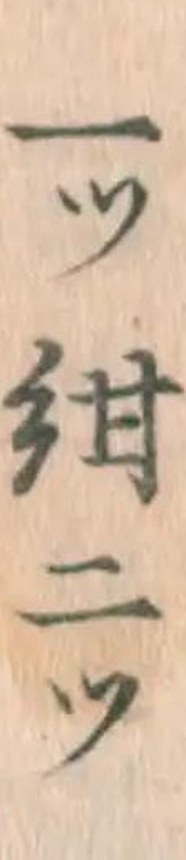一ッ紺二ッ
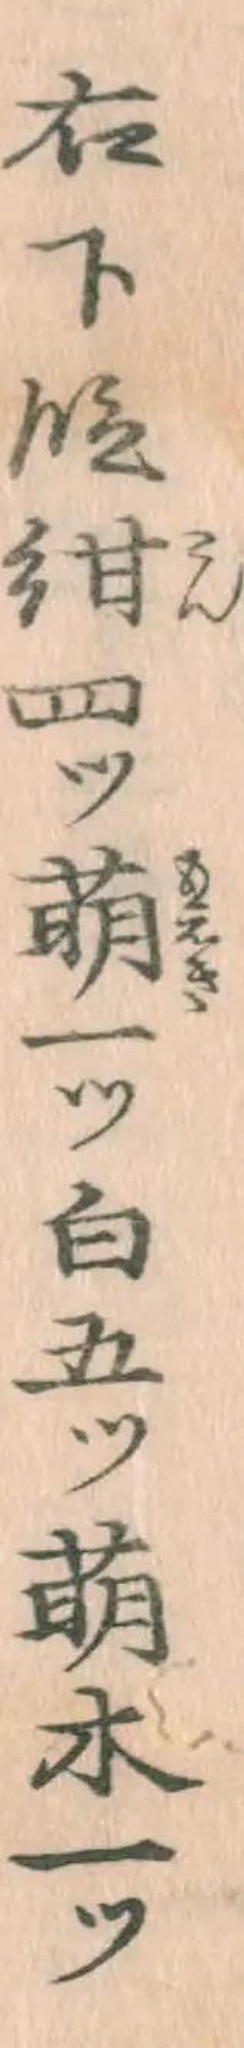右下段紺四ッ萌一ッ白五ッ萌木一ッ
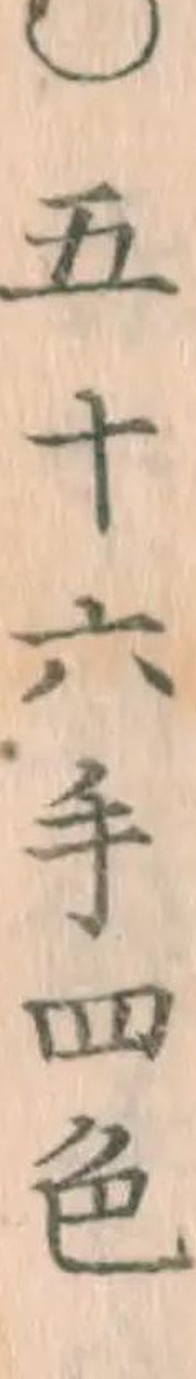○五十六手四色
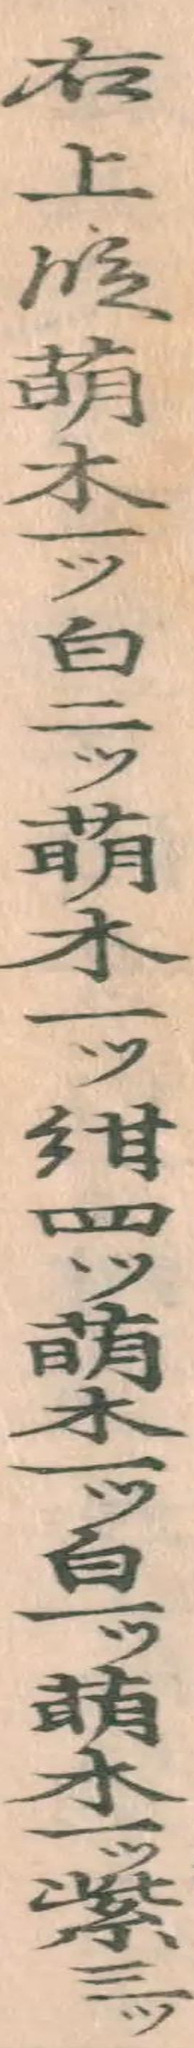右上段萌木一ッ白二ッ萌木一ッ紺四ッ萌木一ッ白一ッ萌木一ッ紫三ッ
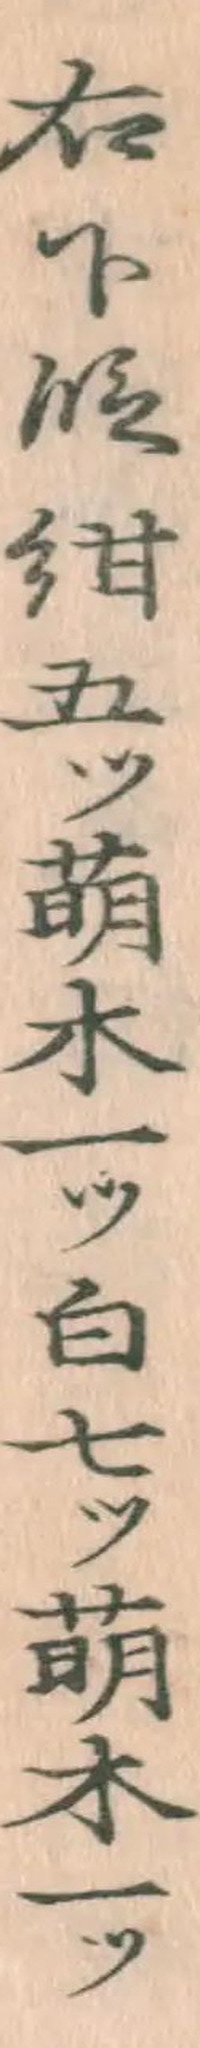右下段紺五ッ萌木一ッ白七ッ萌木一ッ
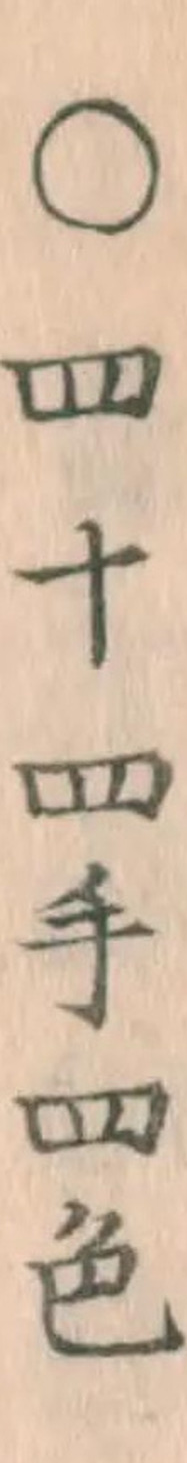○四十四手四色
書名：機織彙編 5巻. [2]
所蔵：国立国会図書館 National Diet Library, JAPAN
